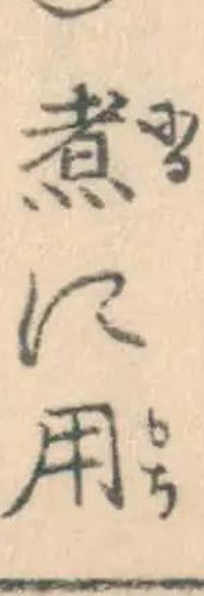煮に用

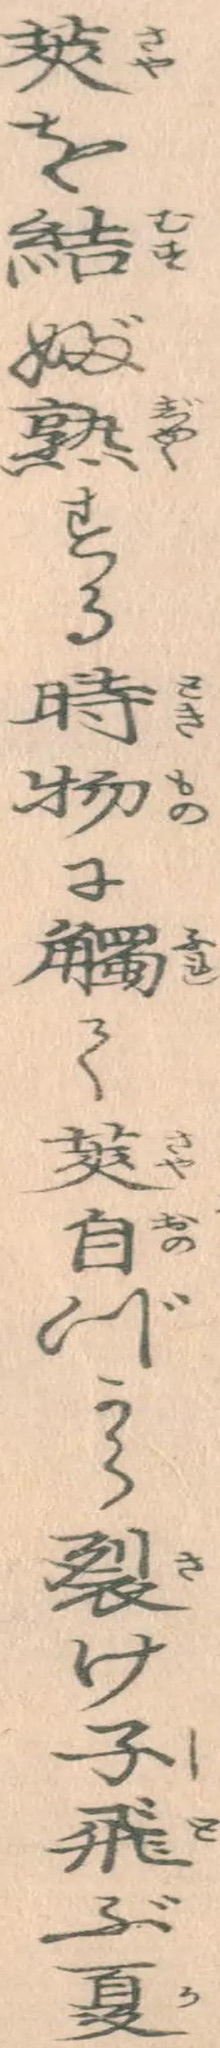莢を結ぶ熟する時物に触て莢自づから裂け子飛ぶ夏

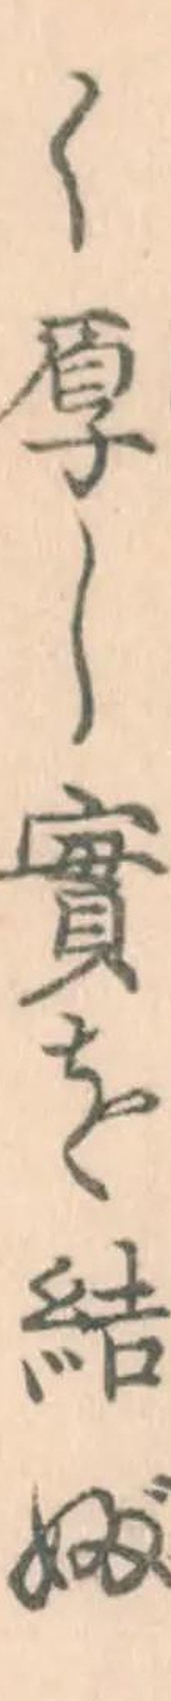く厚し実を結ぶ
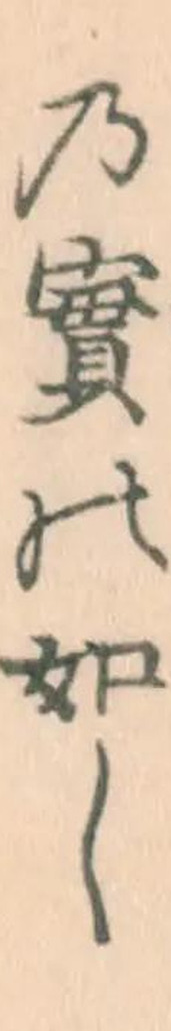の実の如し

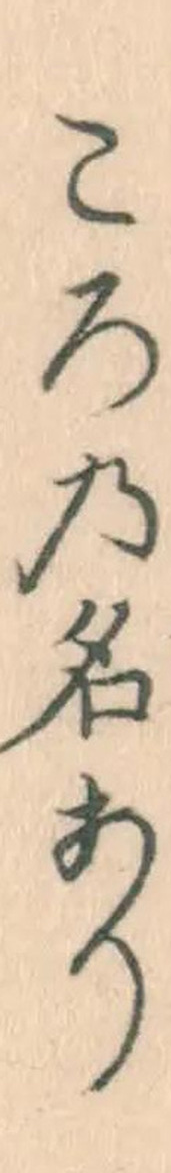ころの名あり

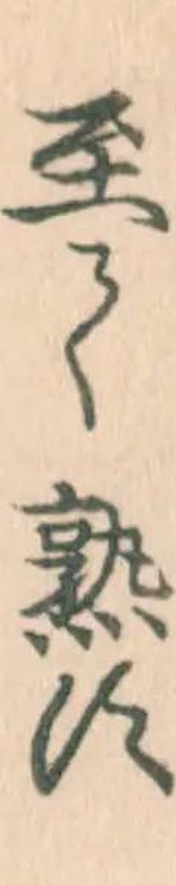至て熟す
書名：有毒草木図説 2巻. [1]
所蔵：国立国会図書館 National Diet Library, JAPAN
